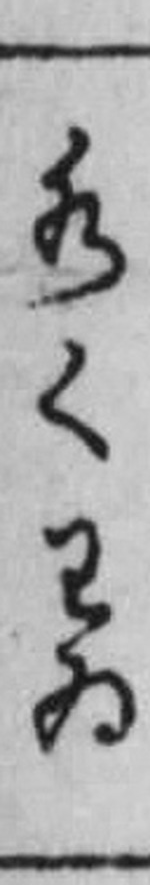水くわゐ
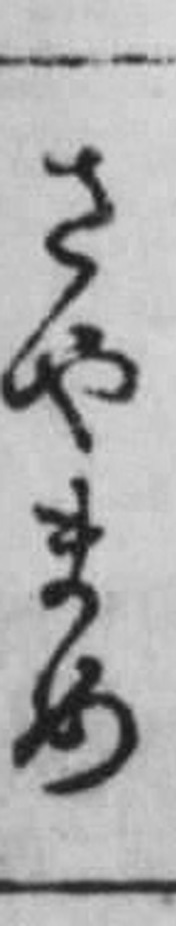さやまめ
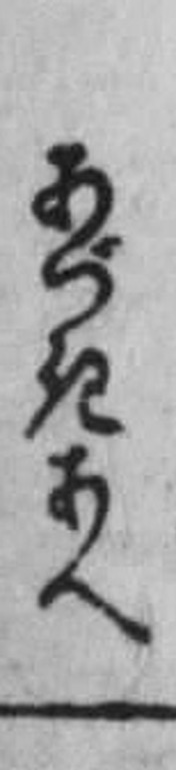あづきあへ
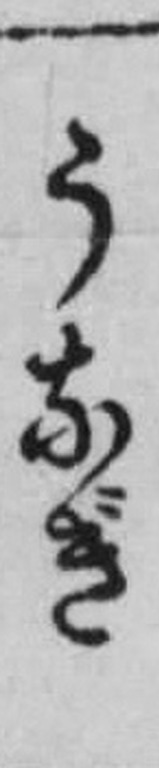うこぎ
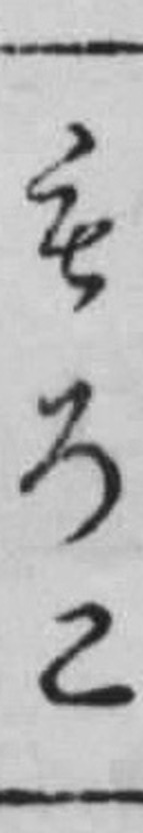もろみ
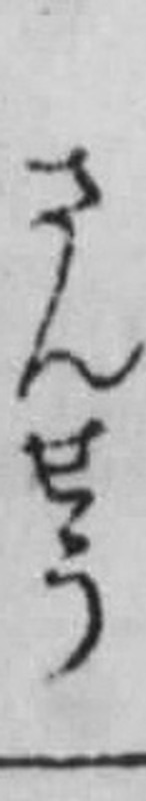さんせう

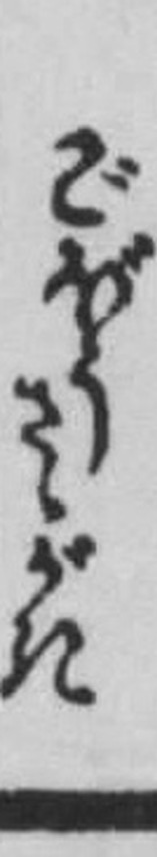ごぼうさゝがき
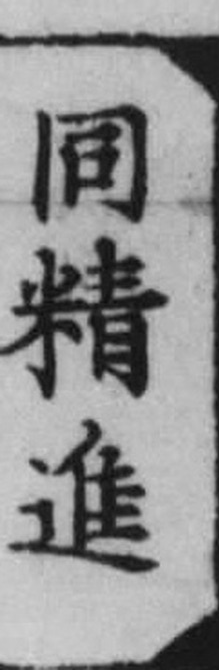同精進
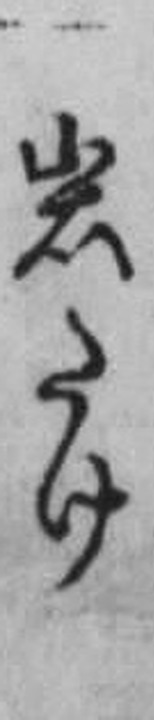岩たけ
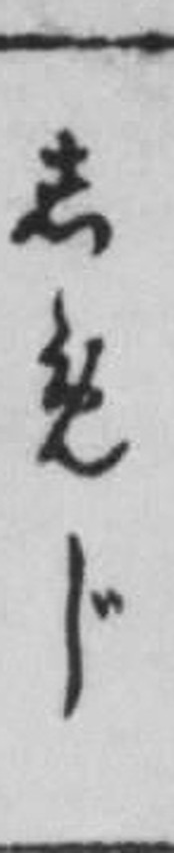しめじ
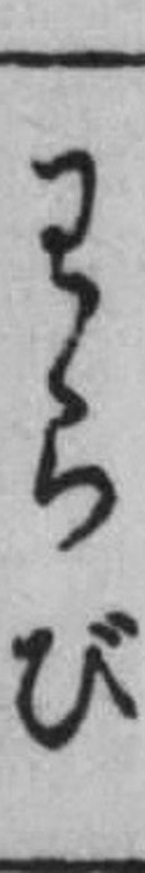わらび
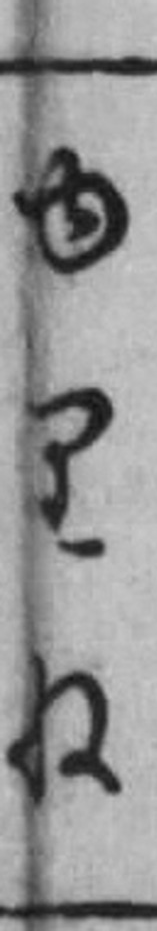ゆりね
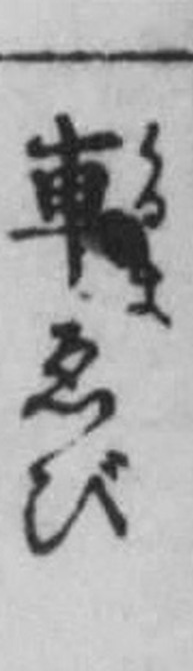車ゑび
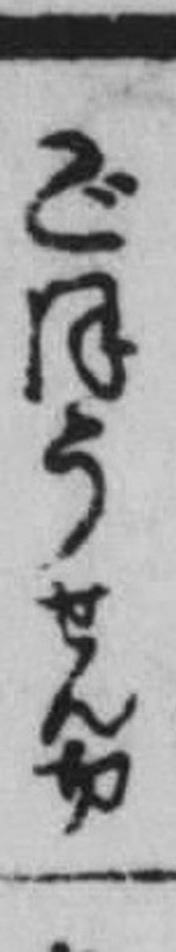ごぼうせん
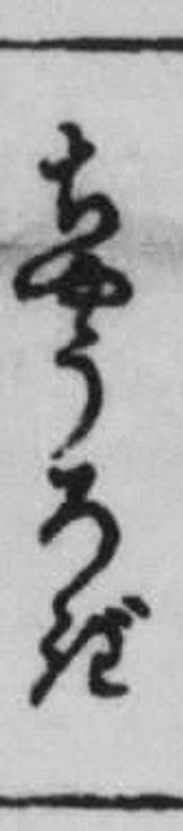ちやうろぎ
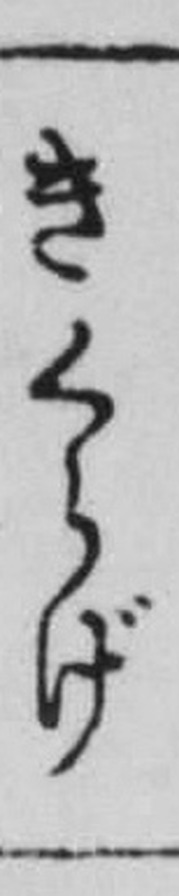きくらげ
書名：日用重宝魚類精進/料理早工風
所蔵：大阪府立大学学術情報センター 国文学研究資料館
